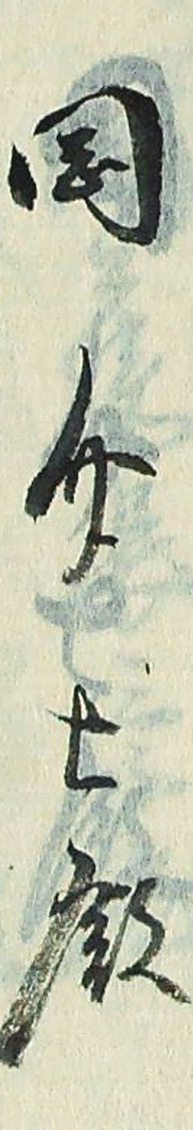岡介七殿
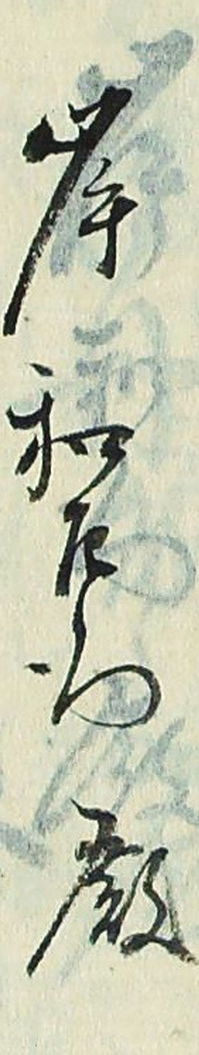岸和左衛門殿
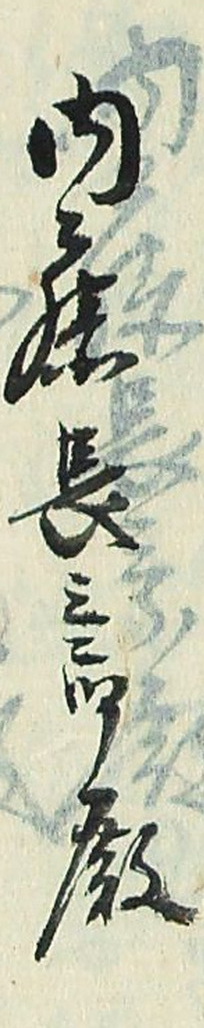内藤長三郎殿
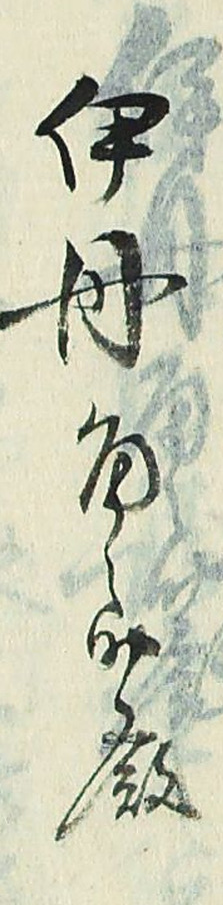伊丹角之助殿

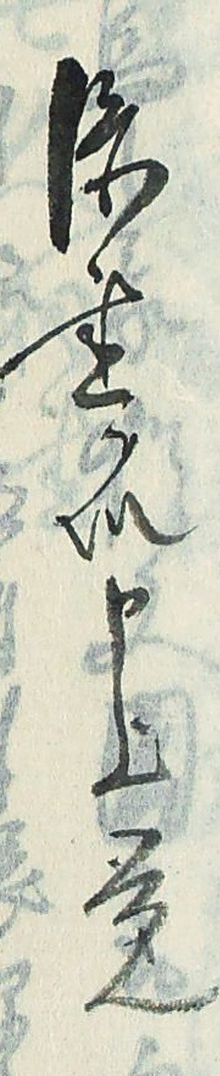添書を以申上覚
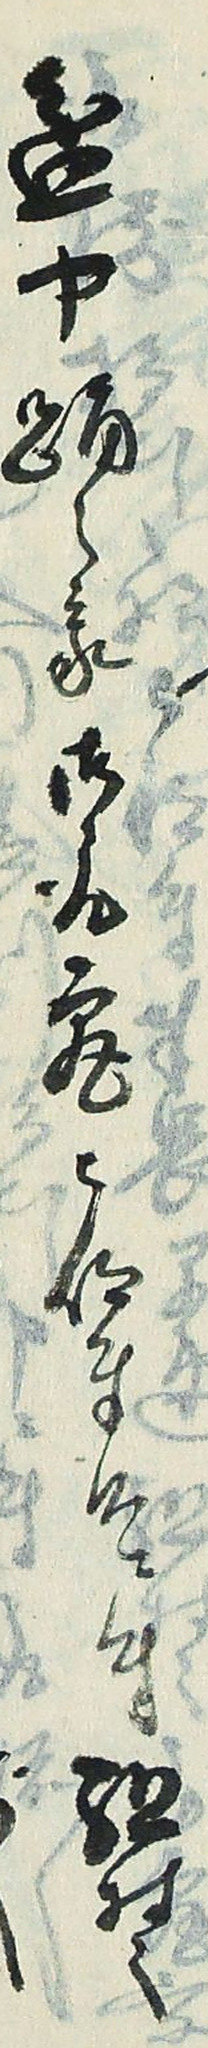盆中踊之義御取究被仰付候に付組村々
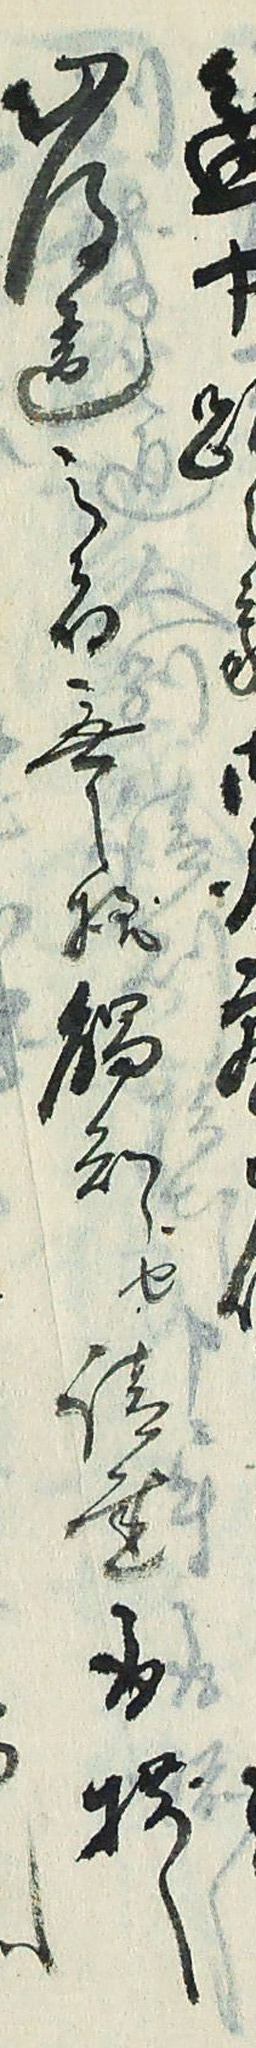心得違之者無之様触知らせ請書取揃へ
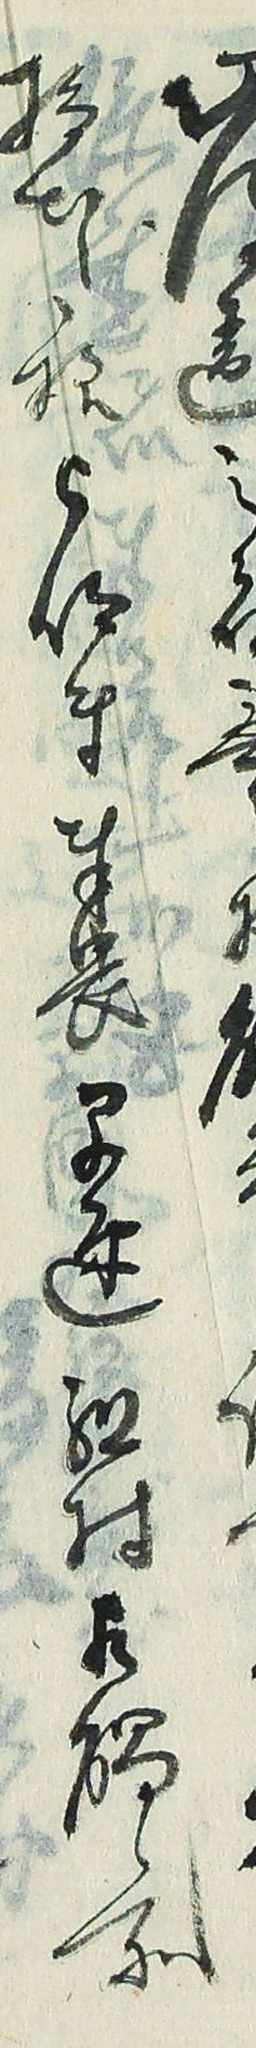指出候様被仰付奉畏早速組村相触候所
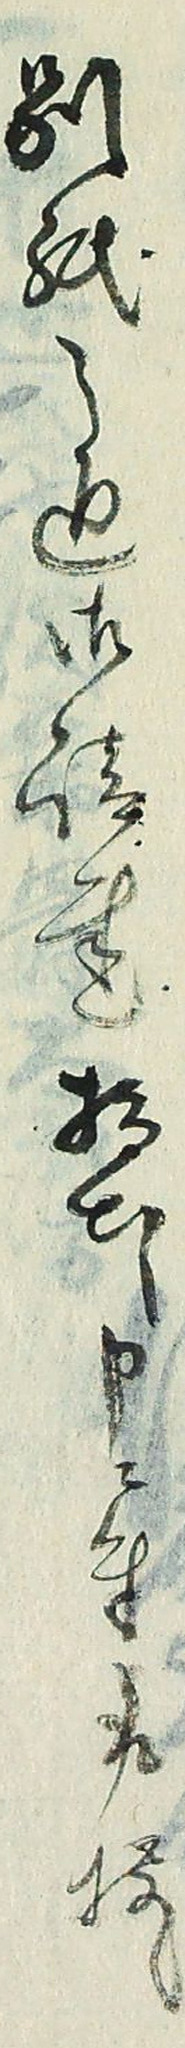別紙之通御請書指出し申に付取揃
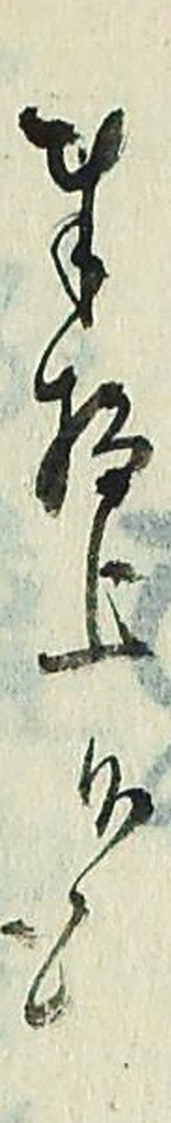奉指上候以上
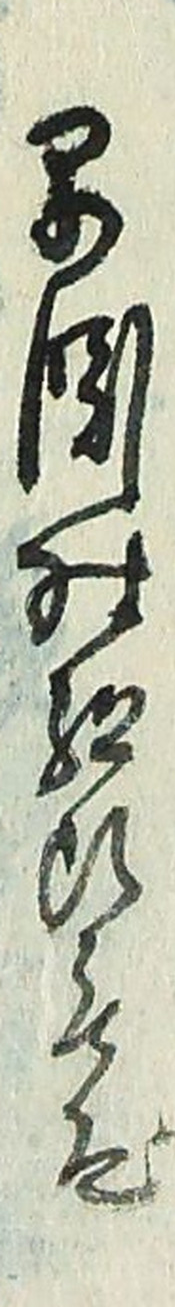早淵村組頭庄屋
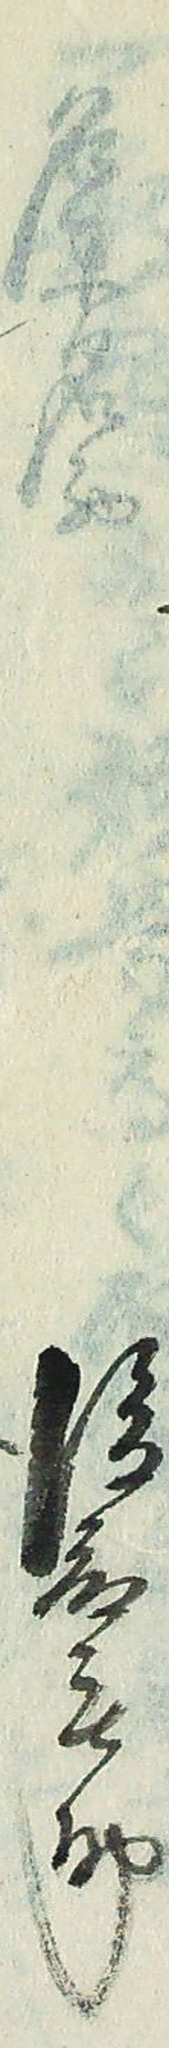後藤庄助
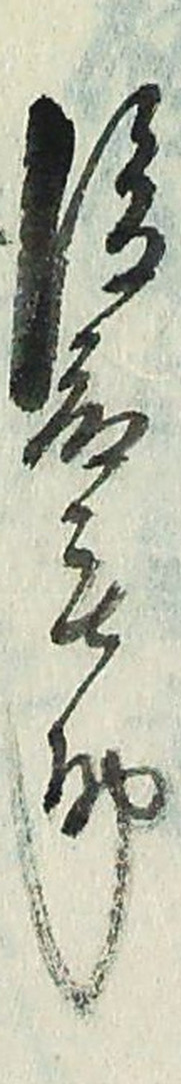後藤庄助
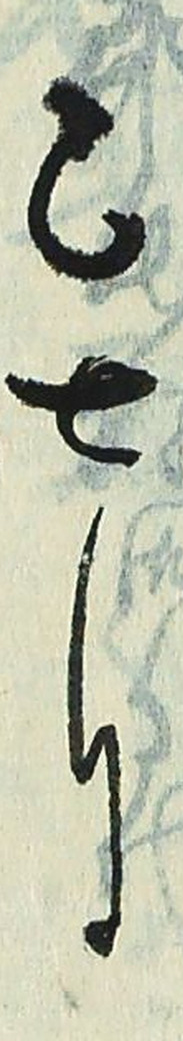巳七月
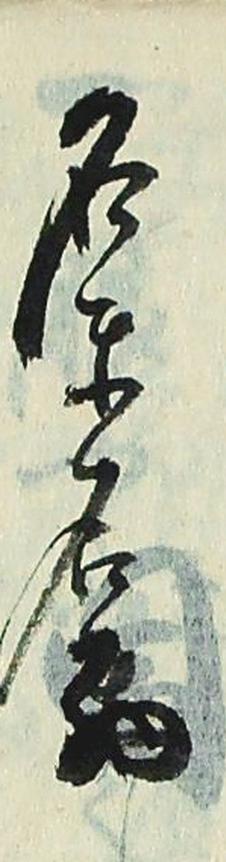名東名西
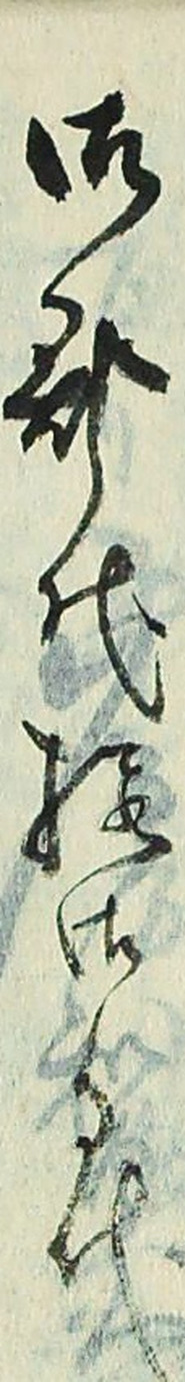御郡代様御手代
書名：諸御用御□受書控
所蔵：鳴門教育大学 Naruto University of Education
